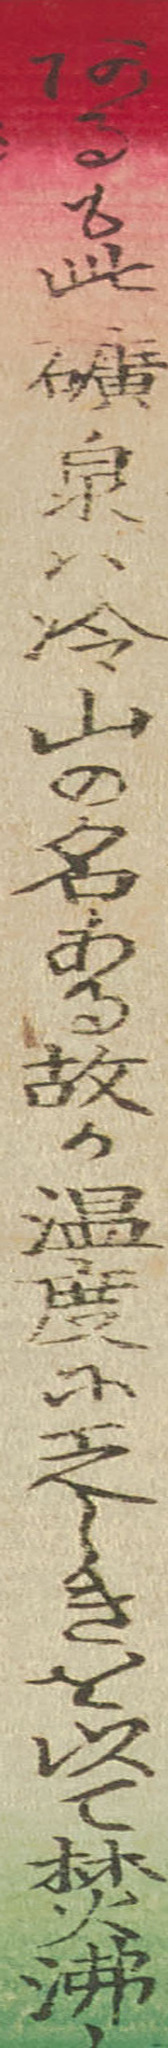あるも此鑛泉ハ冷山の名ある故か温度に乏しきを以て焚沸し
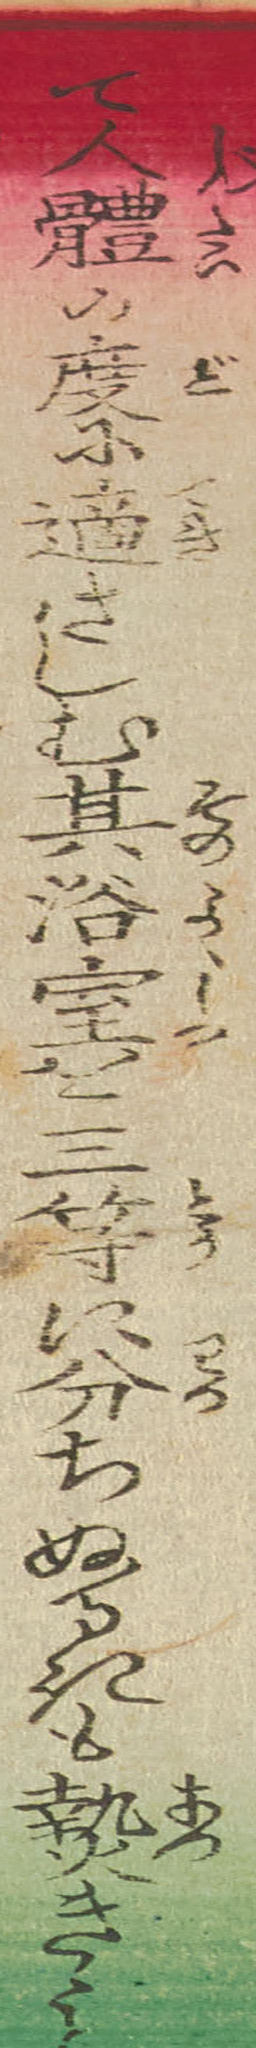て人體の度に適さしむ其浴室を三等に分ちぬるきも熱きも
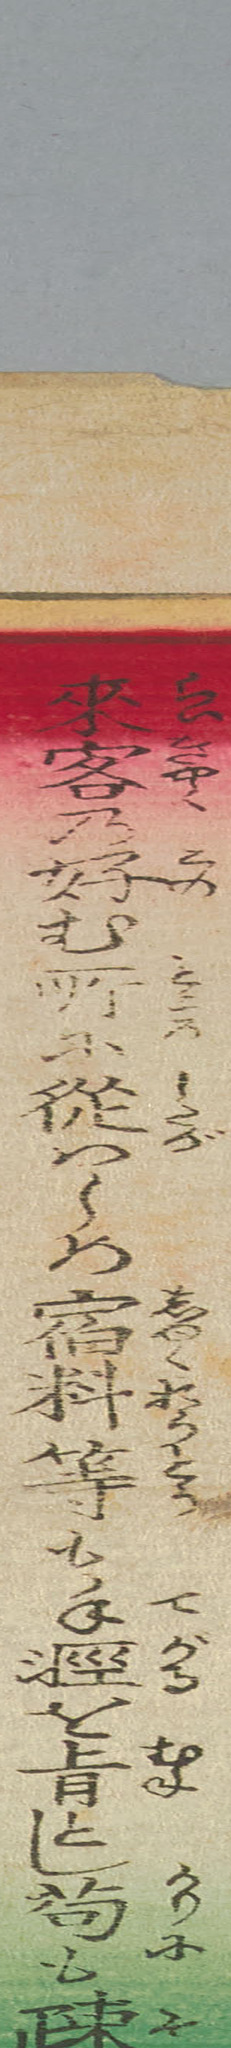来客の好む所に從ハしめ宿料等も手輕を旨とし苟も疎
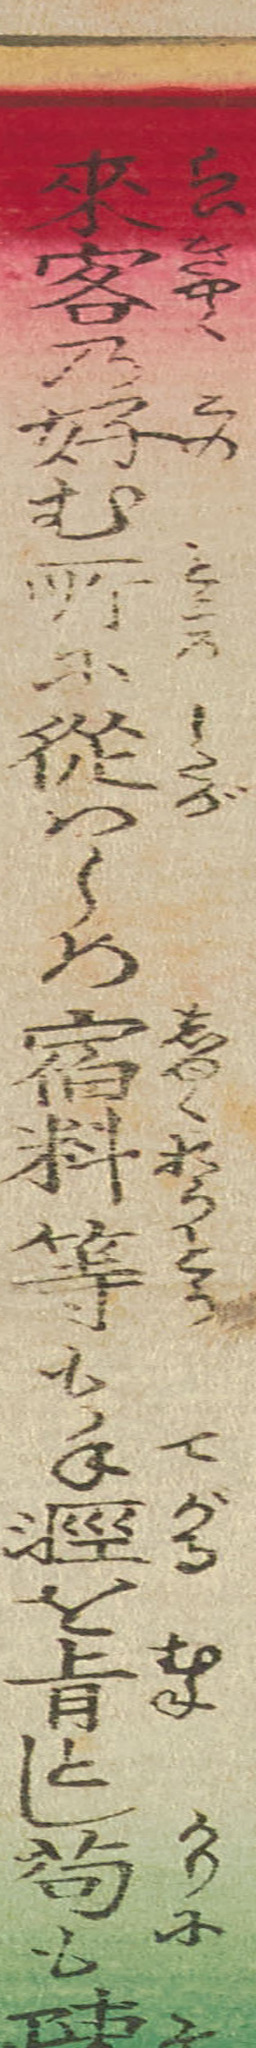来客の好む所に從ハしめ宿料等も手輕を旨とし苟も疎
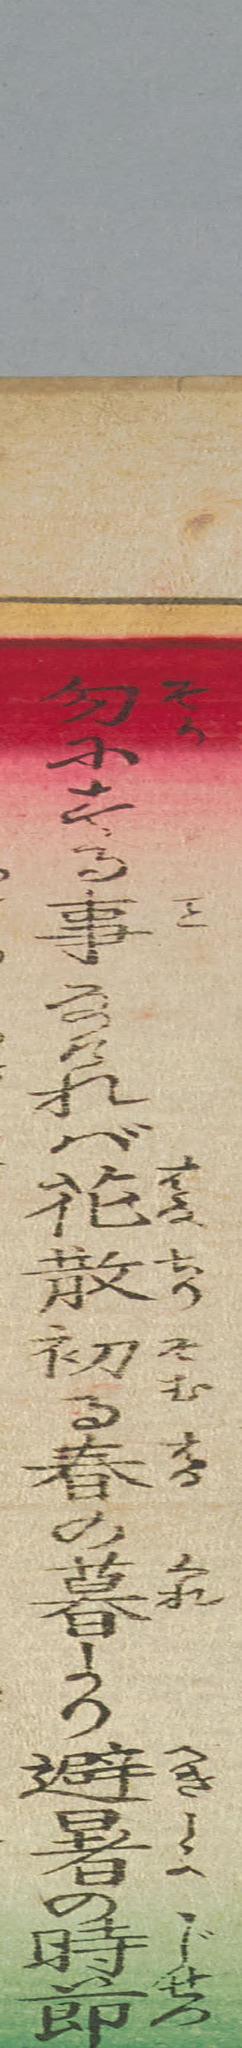勿にする事なけれバ花散初る春の暮より避暑の時節を
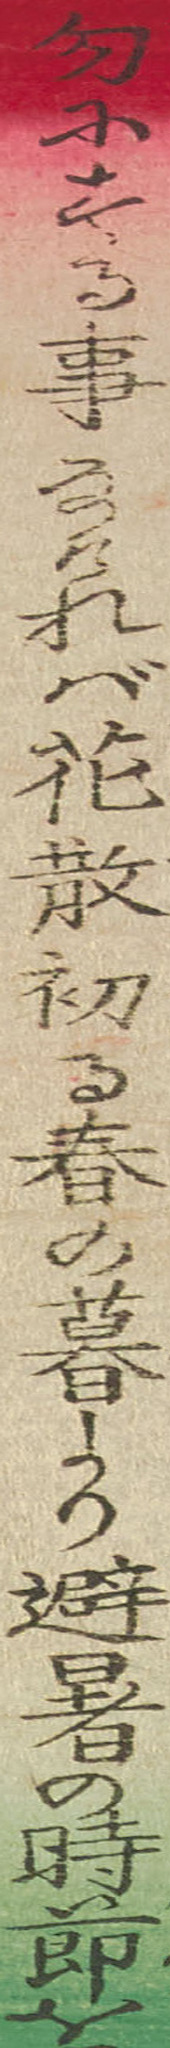勿にする事なけれバ花散初る春の暮より避暑の時節を
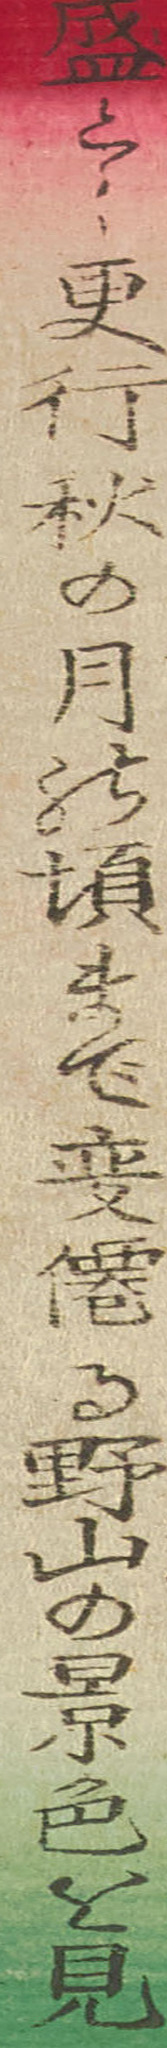盛とし更行秋の月の頃まで変僊る野山の景色を見
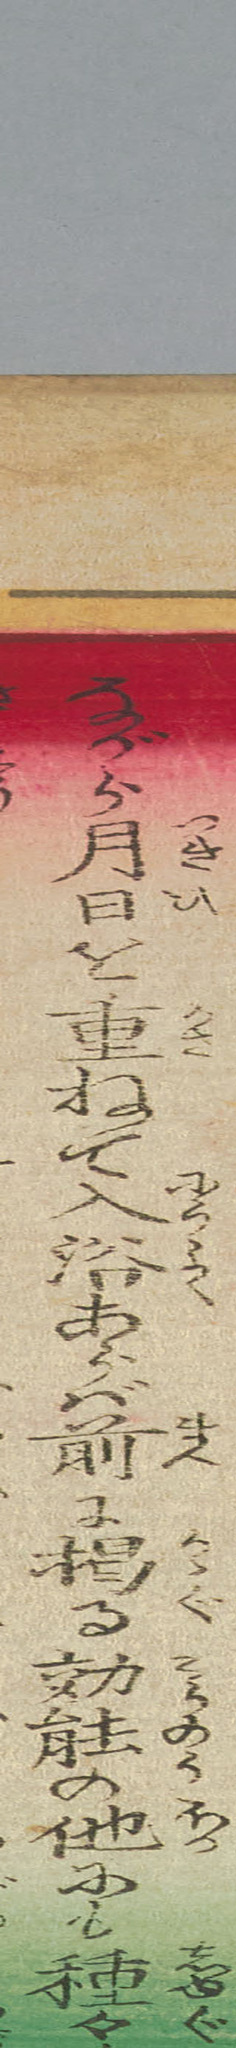ながら月日を重ねて入浴あらバ前に掲る効能の他にも種々の
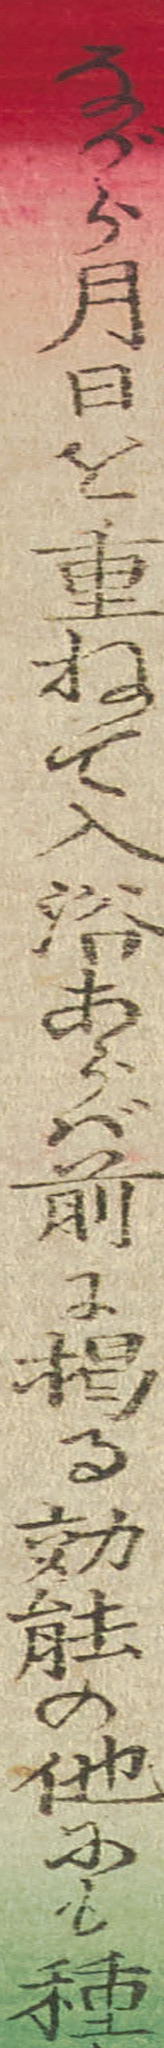ながら月日を重ねて入浴あらバ前に掲る効能の他にも種々の
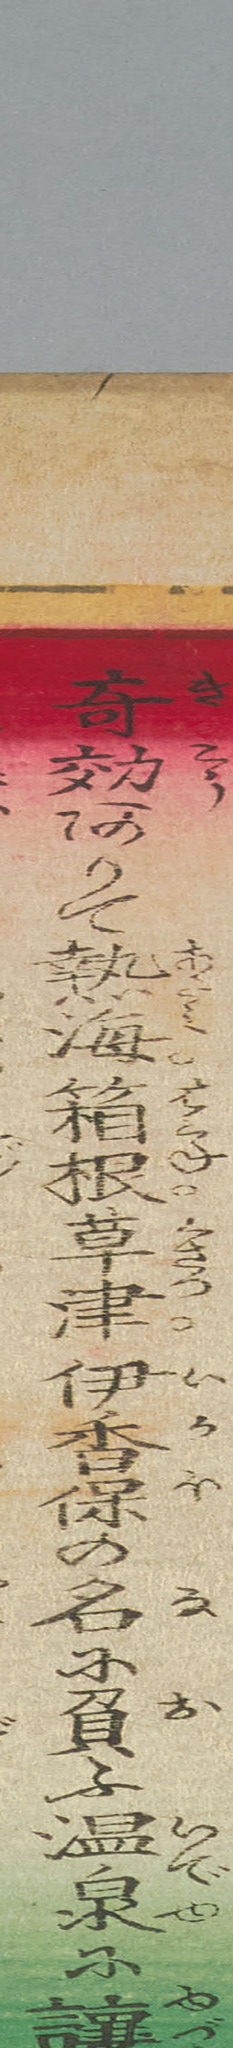奇効ありて熱海。箱根。草津。伊香保の名に負ふ温泉に譲
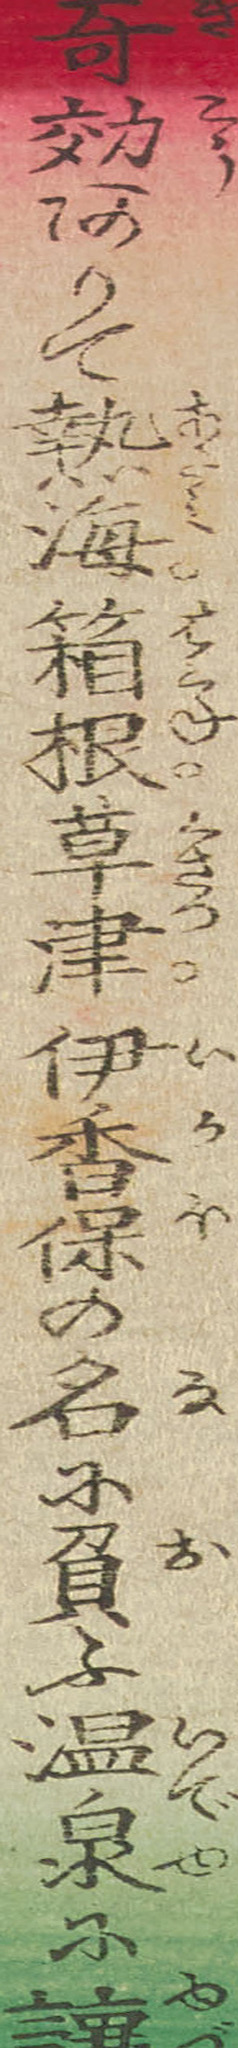奇効ありて熱海。箱根。草津。伊香保の名に負ふ温泉に譲
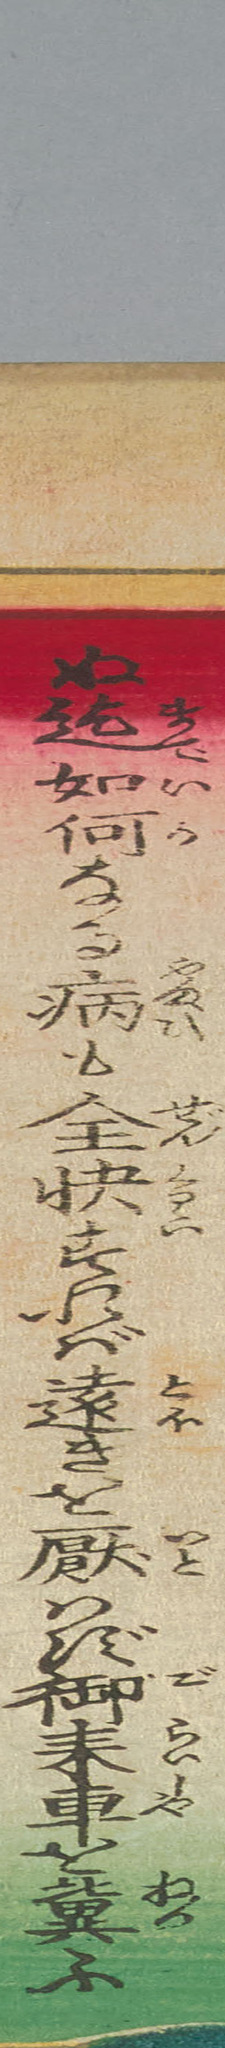ぬ迄如何なる病も全快すれバ遠きを厭ハず御来車を冀ふ
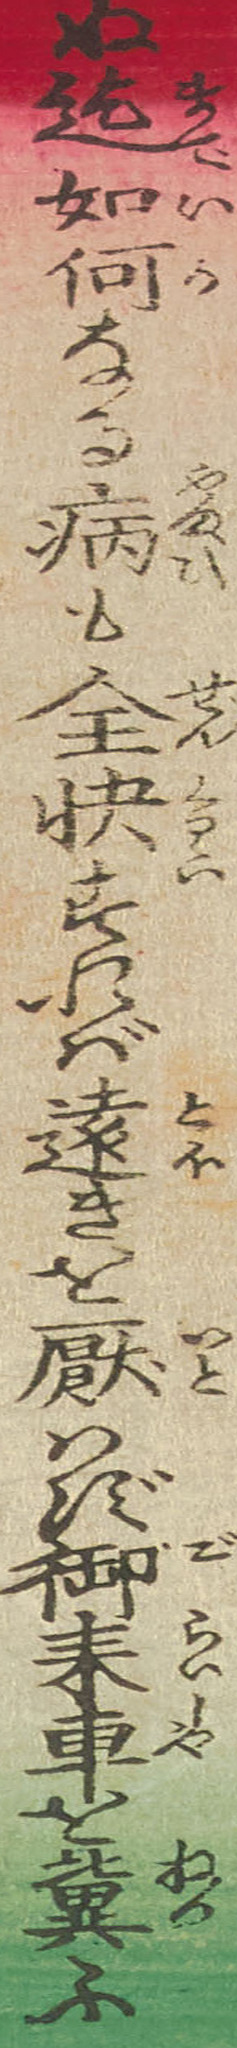ぬ迄如何なる病も全快すれバ遠きを厭ハず御来車を冀ふ
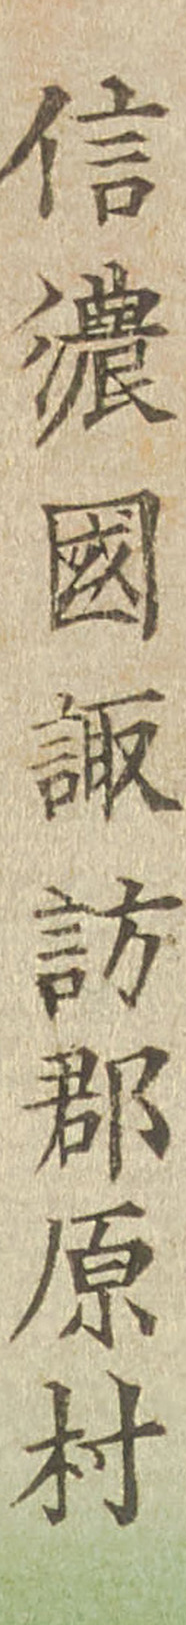信濃國諏訪郡原村
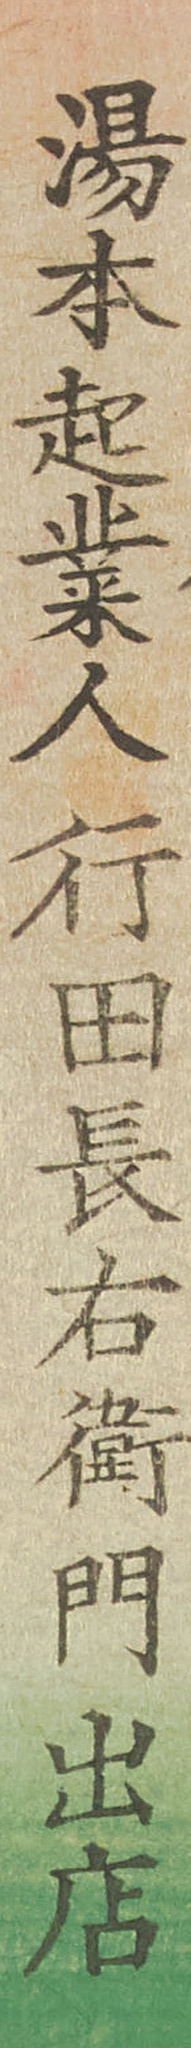湯本起業人行田長右衛門出店
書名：温泉略記
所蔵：東京大学総合図書館 General Library in the University of Tokyo, JAPAN
